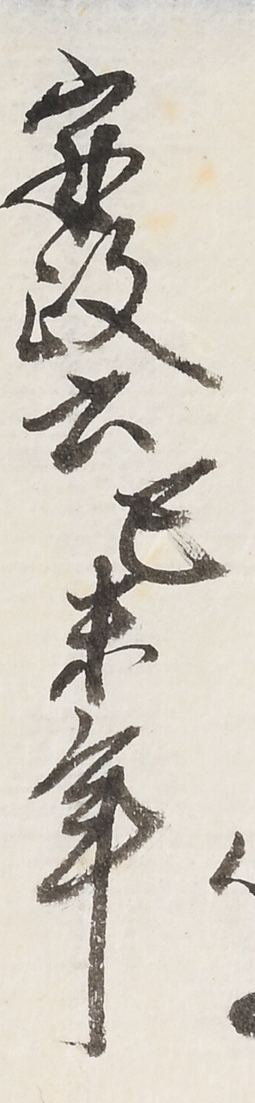安政六己未年
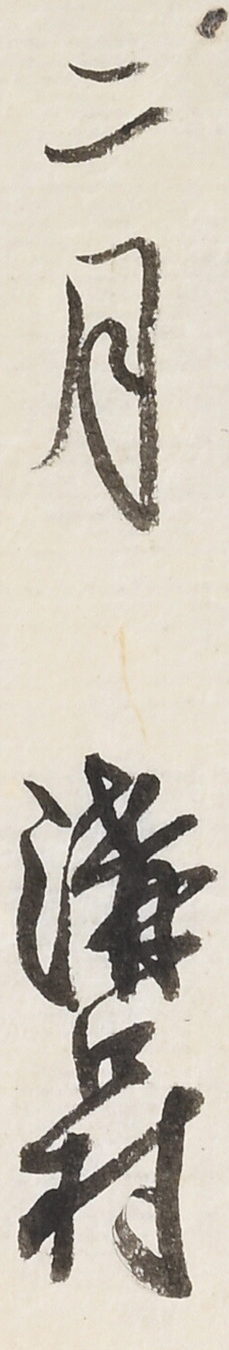二月溝口村
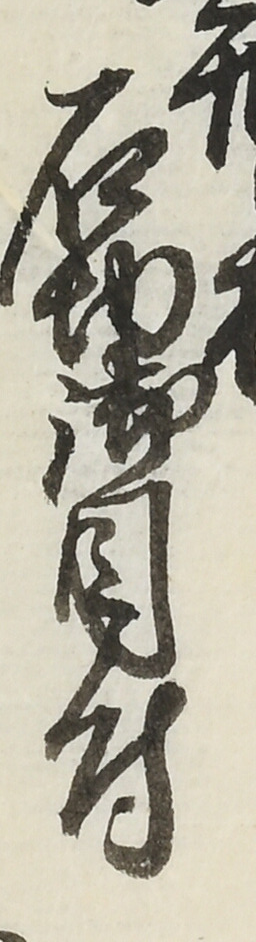石切御目付
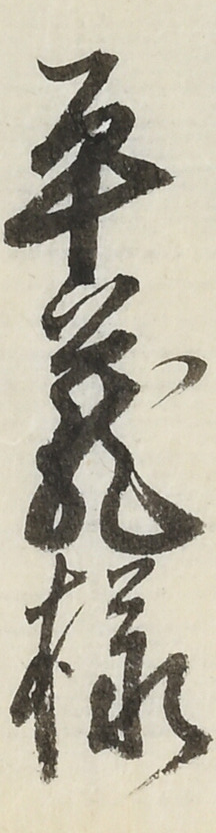平蔵様
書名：安政六己未年正月日他國出石切名前書上帳
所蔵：伊那市立高遠町図書館・合同会社AMANE
